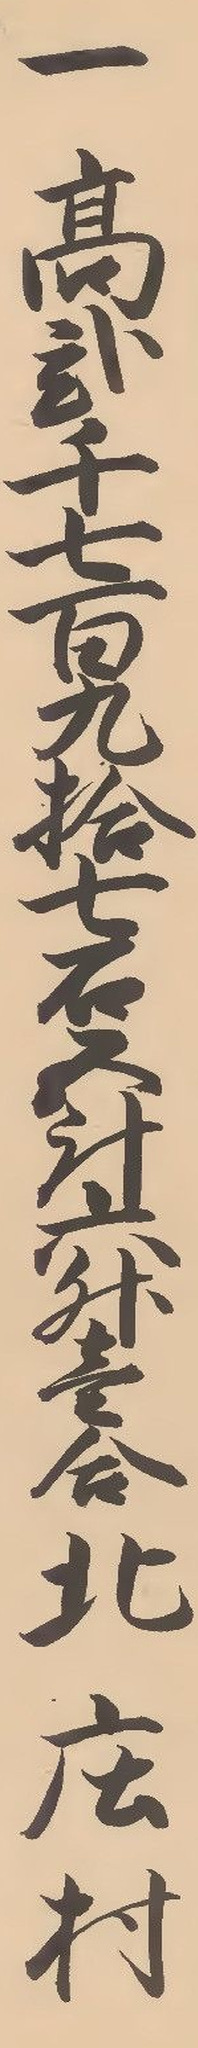一高弐千七百九拾七石五斗六升壱合北庄村
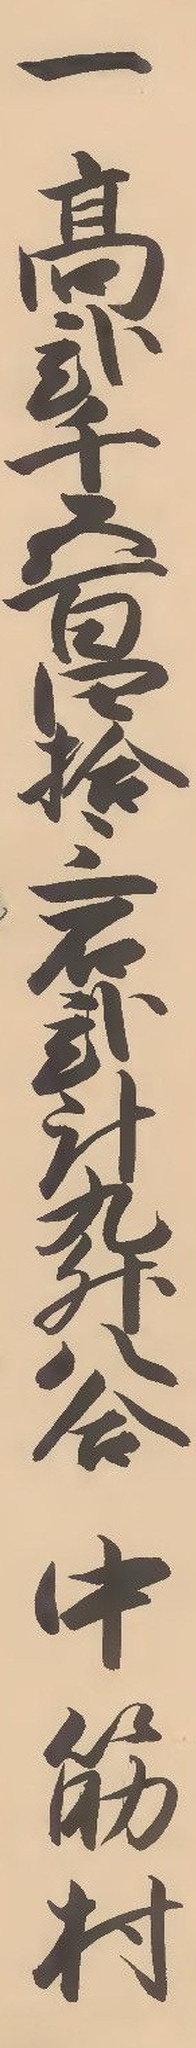一高弐千五百四拾三石弐斗九升八合中筋村

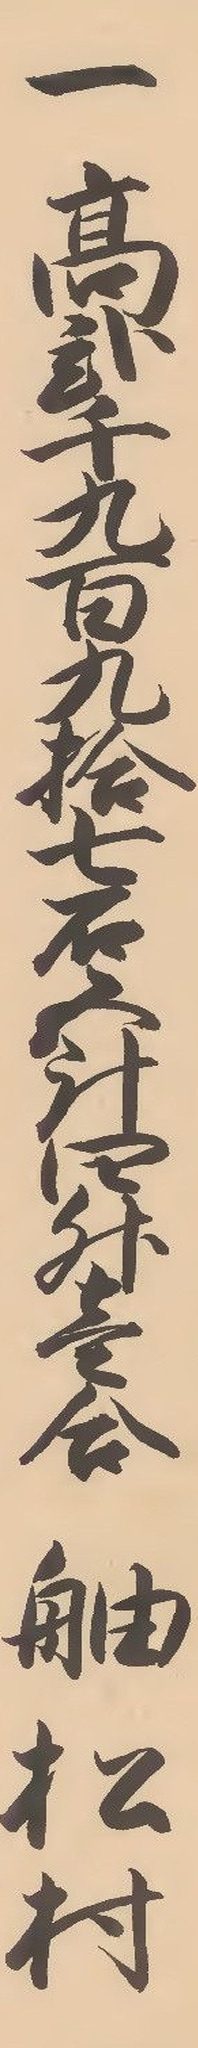一高弐千九百九拾七石五斗四升壱合舳松村
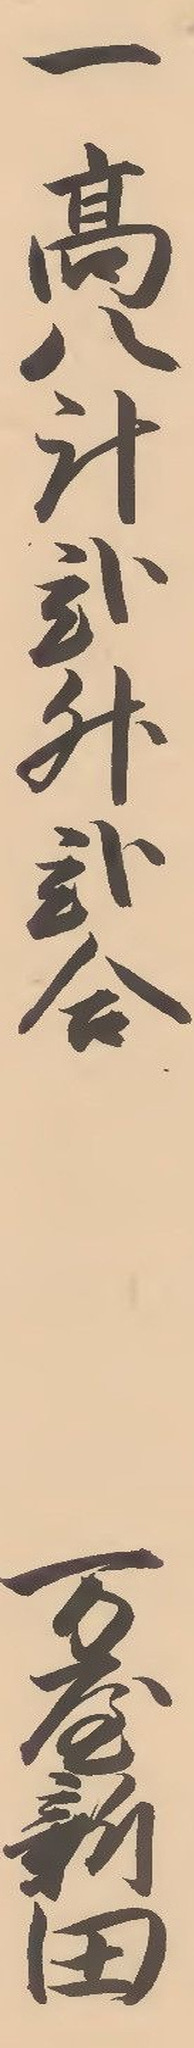一高八斗弐升弐合万屋新田
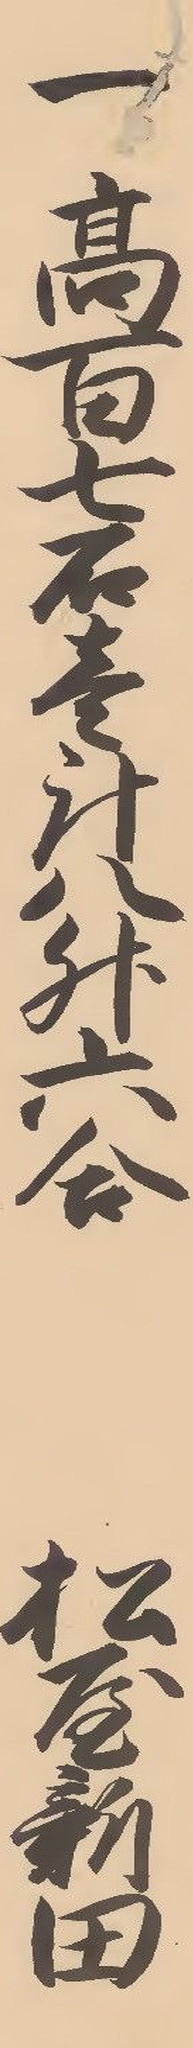一高百七石壱斗八升六合松屋新田
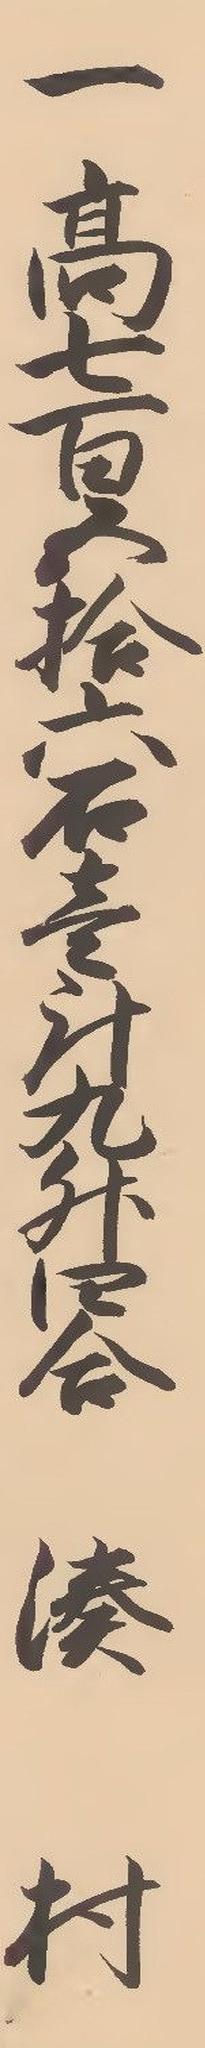一高七百五拾六石壱斗九升四合湊村
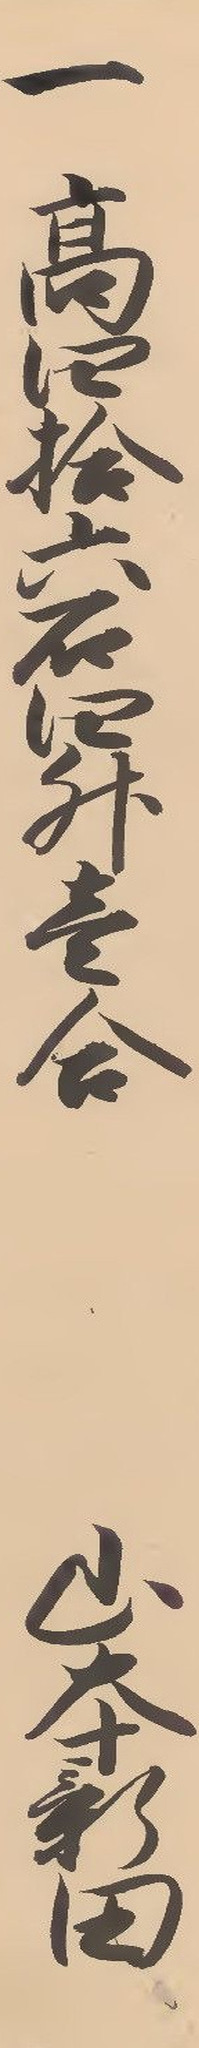一高四拾六石四升壱合山本新田
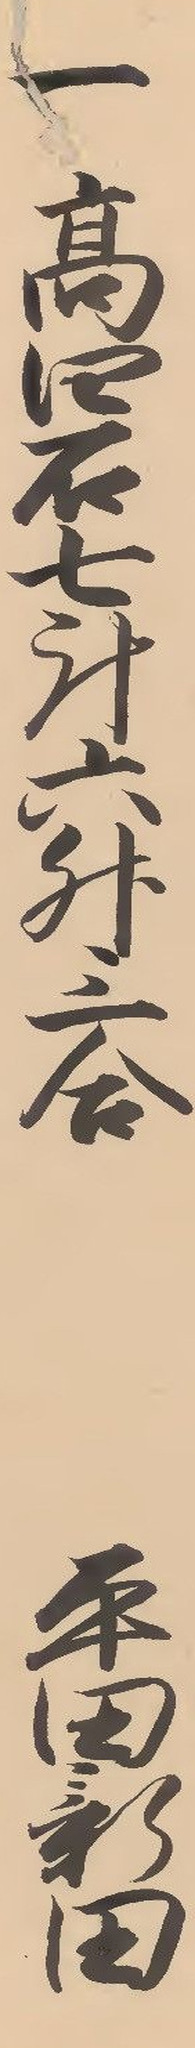一高四石七斗六升三合平田新田
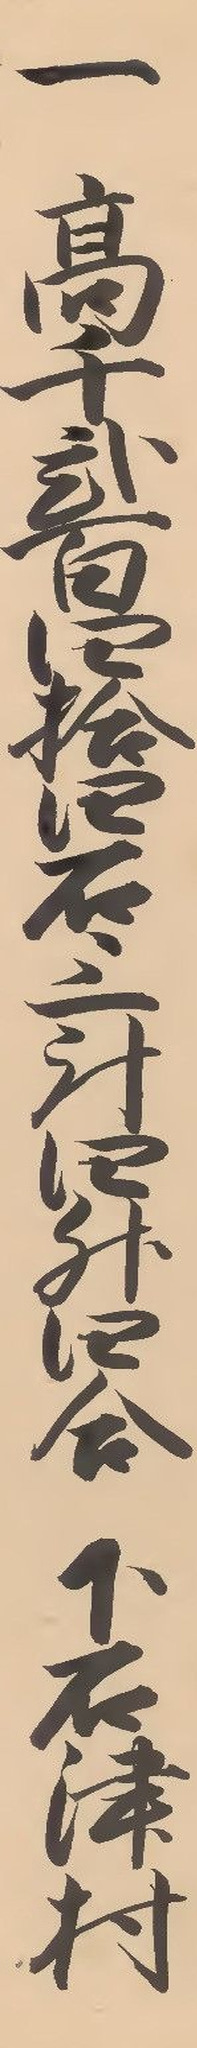一高千弐百四拾四石三斗四升四合下石津村
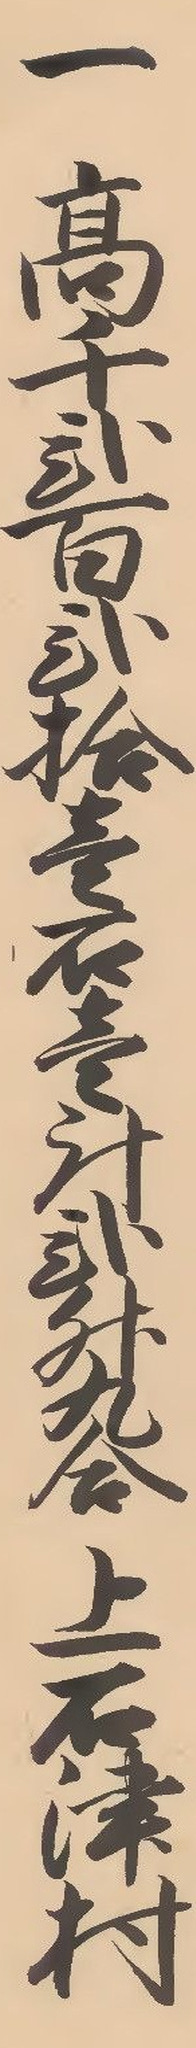一高千弐百弐拾壱石壱斗弐升九合上石津村

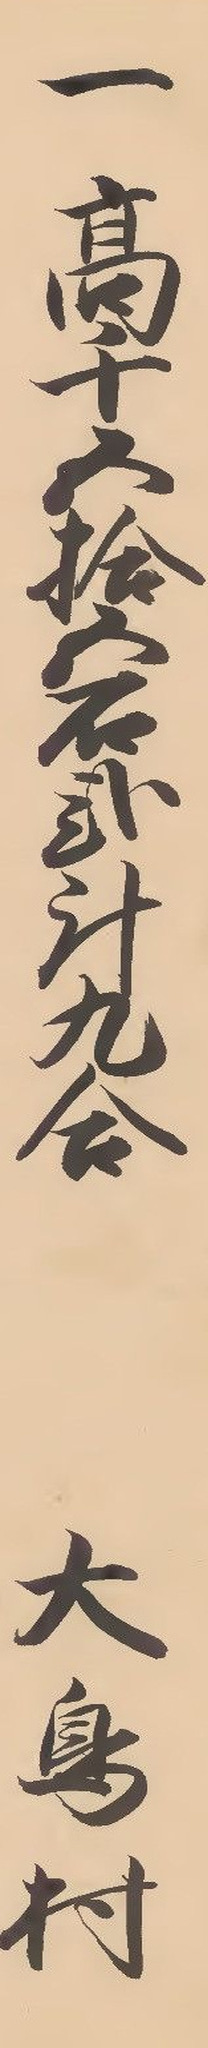一高千五拾五石弐斗九合大鳥村
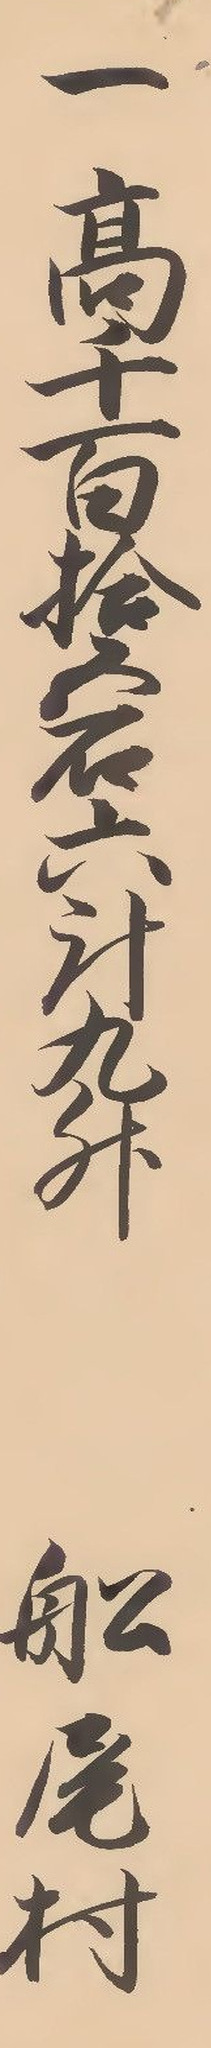一高千百拾五石六斗九升船尾村
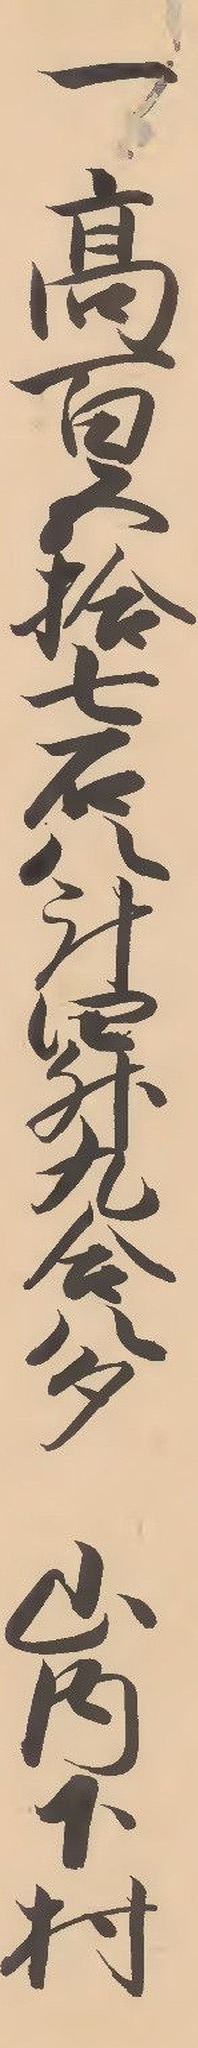一高百五拾七石八斗四升九合八勺山内下村
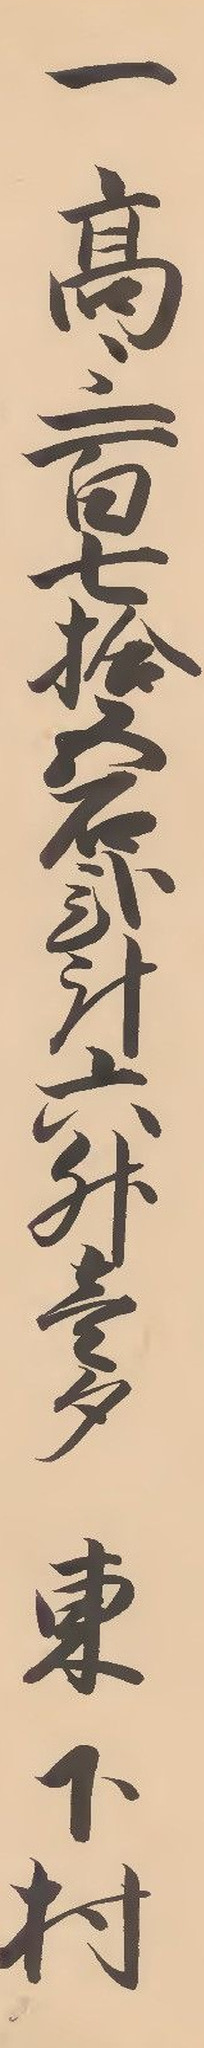一高三百七拾五石弐斗六升壱勺東下村
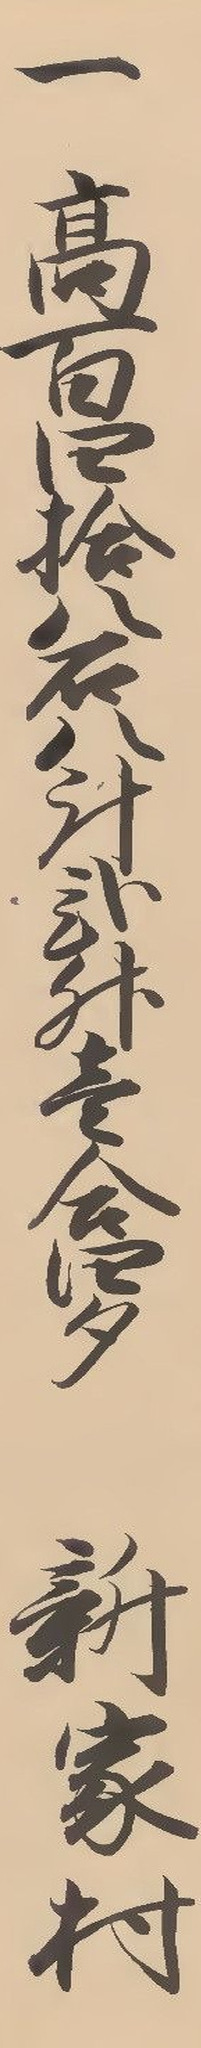一高百四拾八石八斗弐升壱合四勺新家村
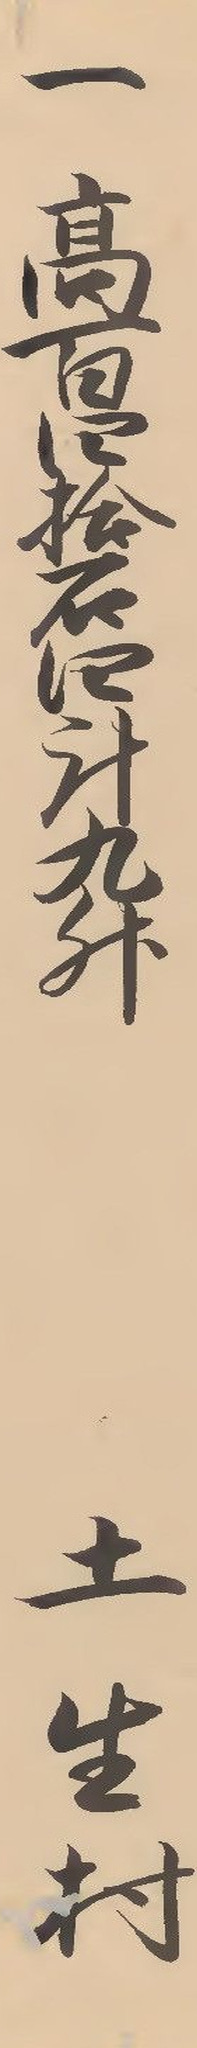一高百四拾石四斗九升土生村
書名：和泉国郷帳
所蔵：国立公文書館 National Archives of Japan
